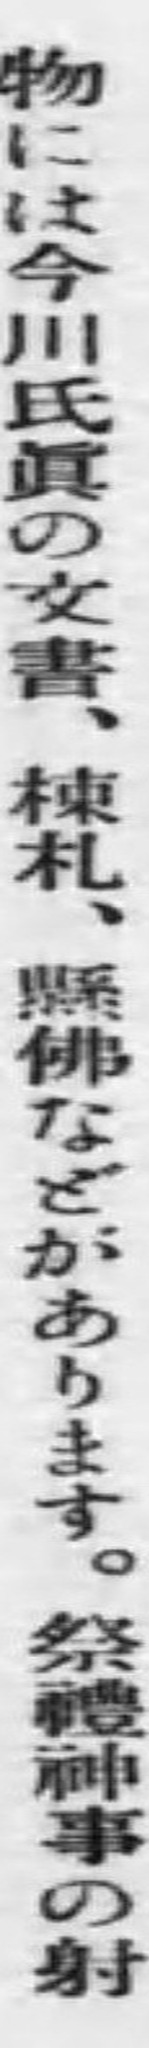物には今川氏真の文書、棟札、懸仏などがあります。祭礼神事の射
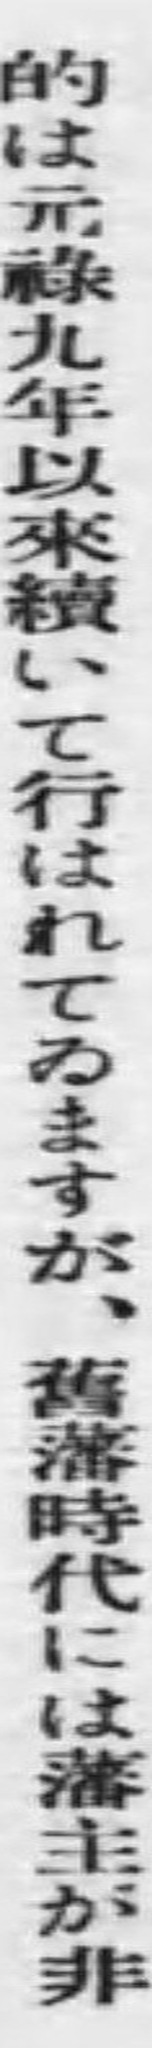的は元禄九年以来続いて行はれてゐますが、旧藩時代には藩主が非
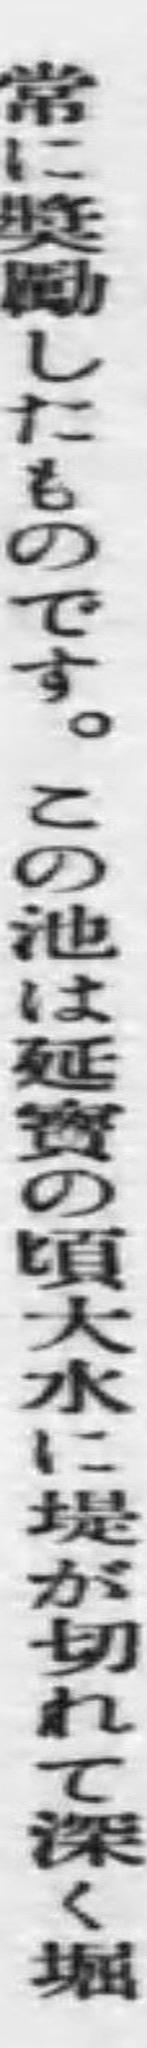常に奨励したものです。この池は延宝の頃大水に堤が切れて深く堀

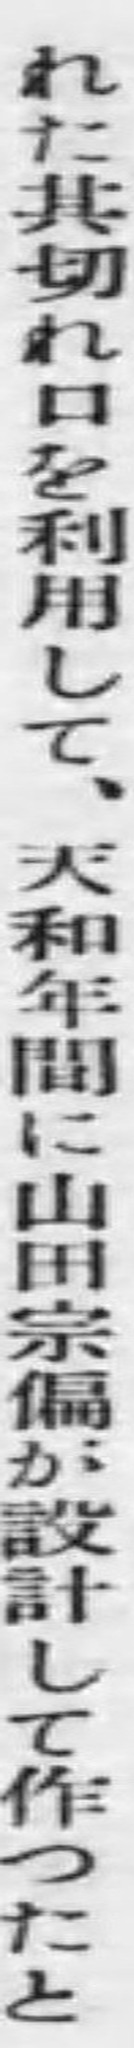れた其切れ口を利用して、天和年間に山田宗偏が設計して作つたと
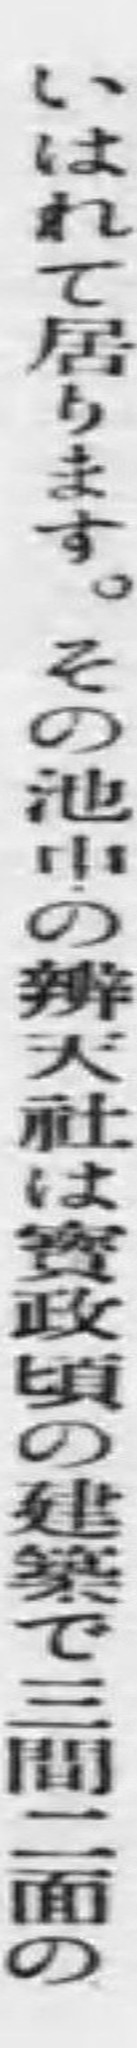いはれて居ります。その池中の弁天社は宝政頃の建築で三間二面の
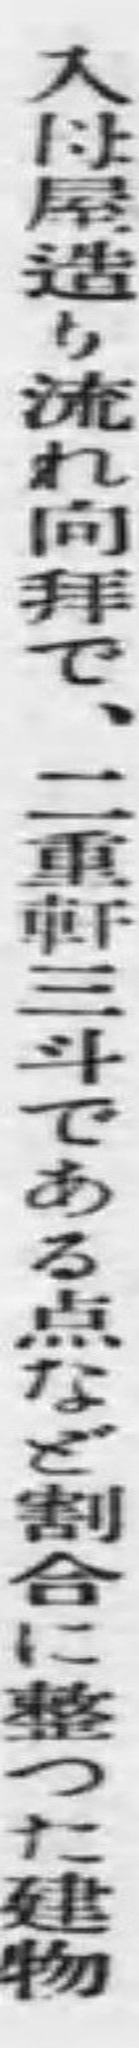入母屋造り流れ向拝で、二重軒三斗である点など割合に整つた建物
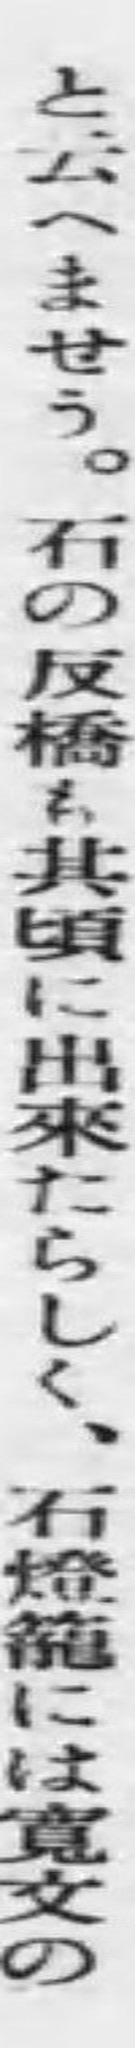と云へませう。石の反橋も其頃に出来たらしく、石灯籠には寛文の
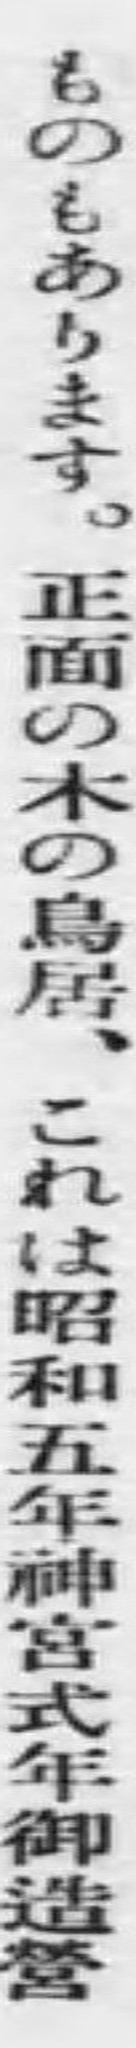ものもあります。正面の木の鳥居、これは昭和五年神宮式年御造営
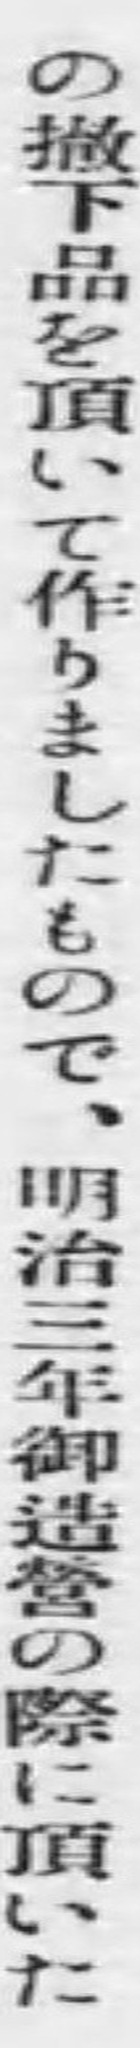の撤下品を頂いて作りましたもので、明治三年御造営の際に頂いた
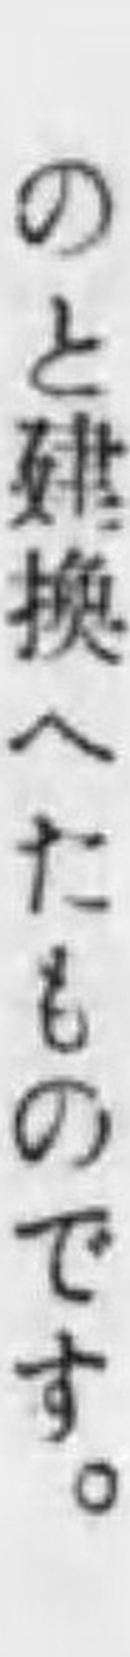のと建換へたものです。
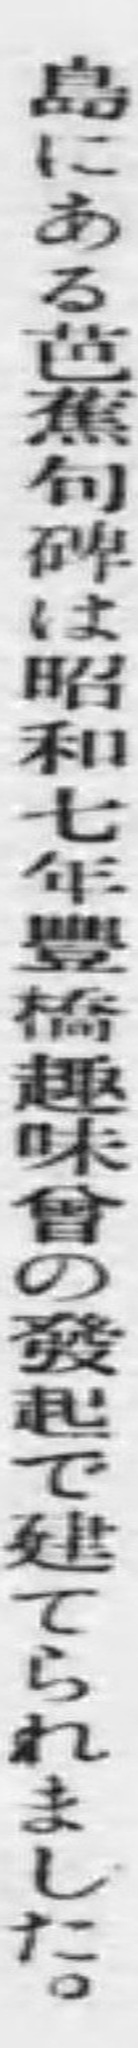島にある芭蕉句碑は昭和七年豊橋趣味曽の発起で建てられました。
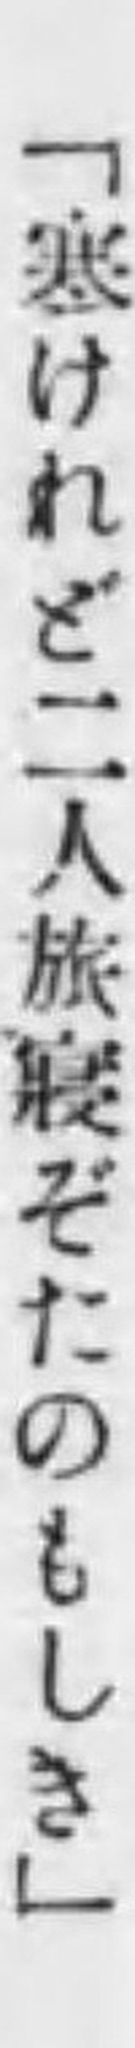「寒けれど二人旅寝ぞたのもしき」
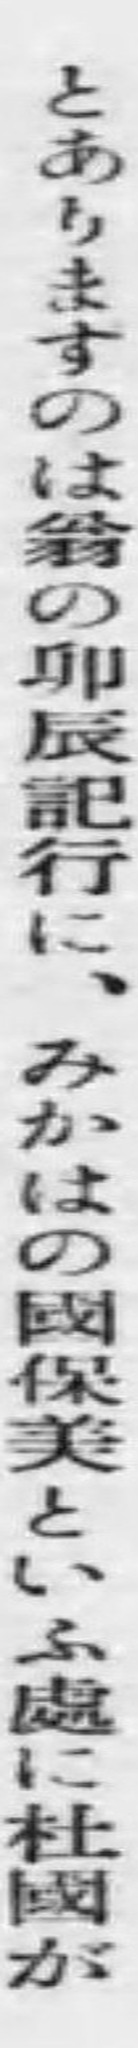とありますのは翁の卯辰記行に、みかはの国保美といふ処に杜国が
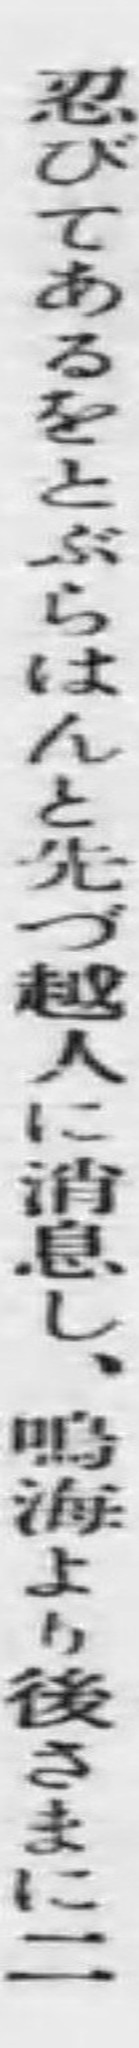忍びてあるをとぶらはんと先づ越人に消息し、鳴海より後さまに二
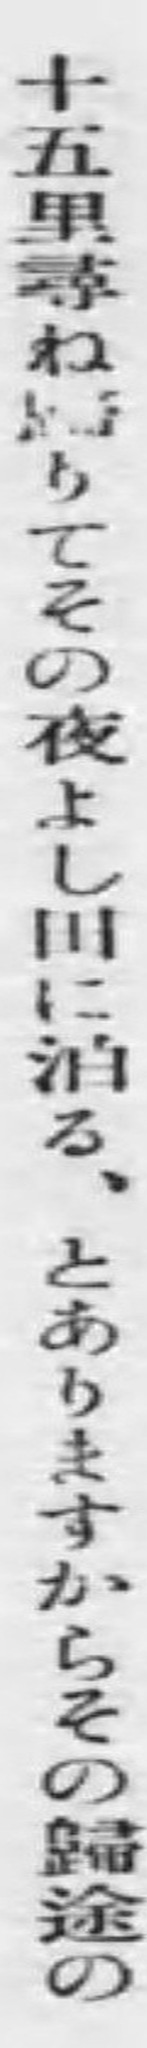十五里尋ね帰りてその夜よし田に泊る、とありますからその帰途の
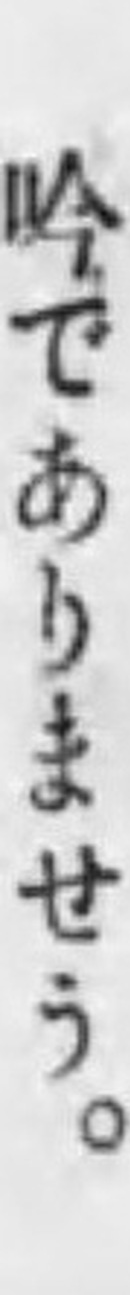吟でありませう。
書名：東三河道中記 : 豊橋市及其附近案内
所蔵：国立国会図書館 National Diet Library, JAPAN
